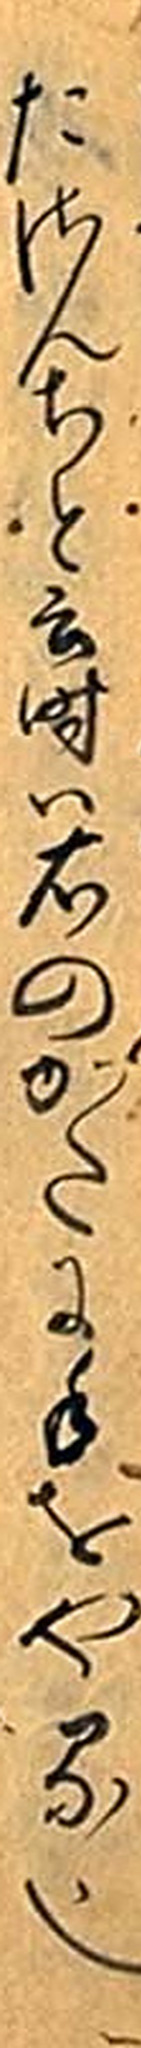たさんちと云時は右のかたに手をやる也
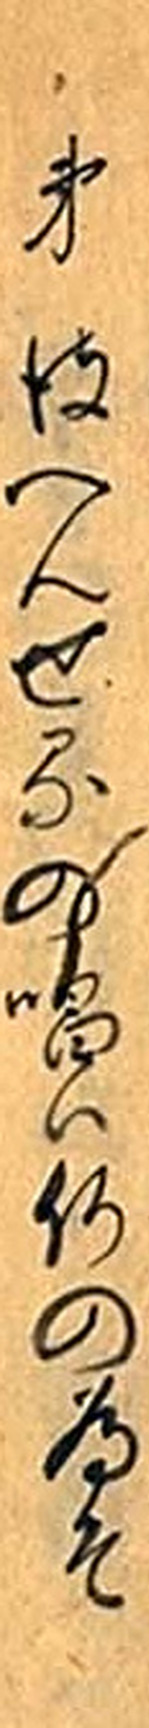弟彼へんせるの唱は何の為そ
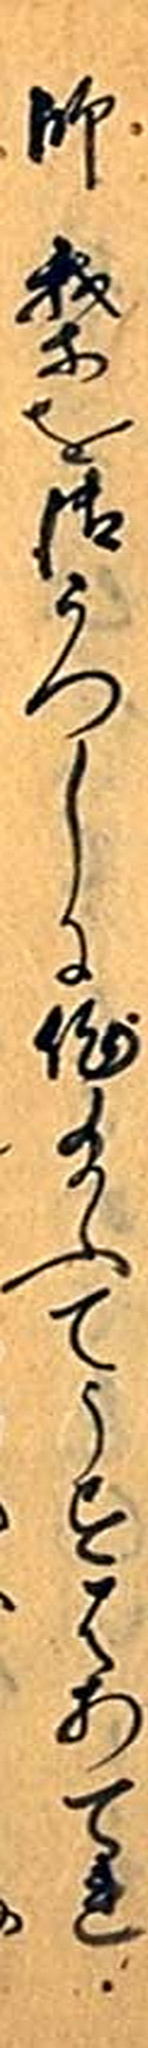師我等を御うつしに作給ふてうすはあてれ
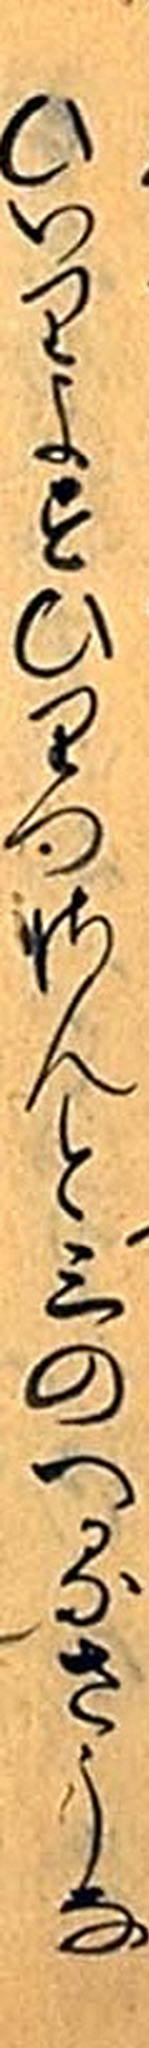ひいりよすひりつさんと三のへるさうな
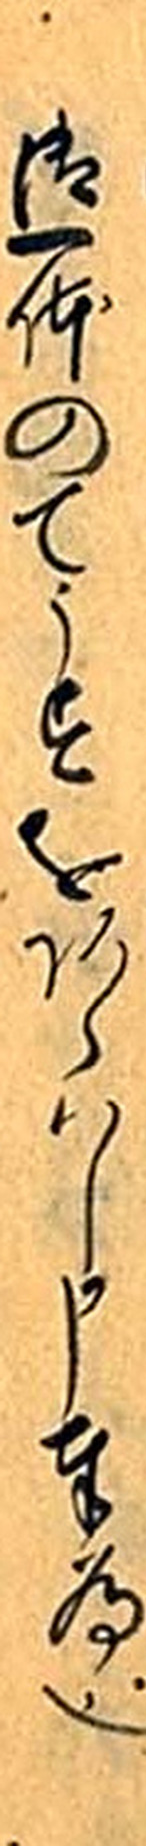御一体のてうすをあらはし申奉為也
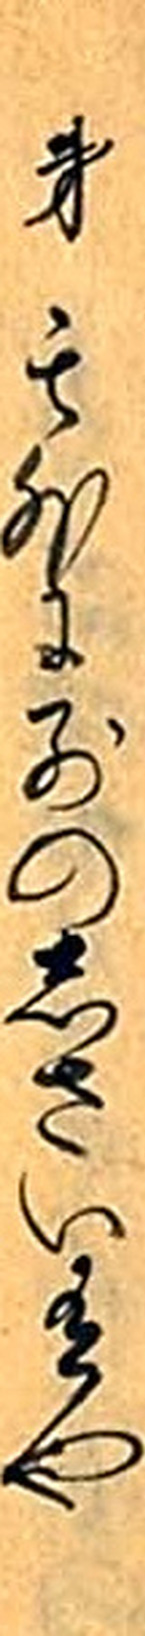弟其外に別のしさい有や
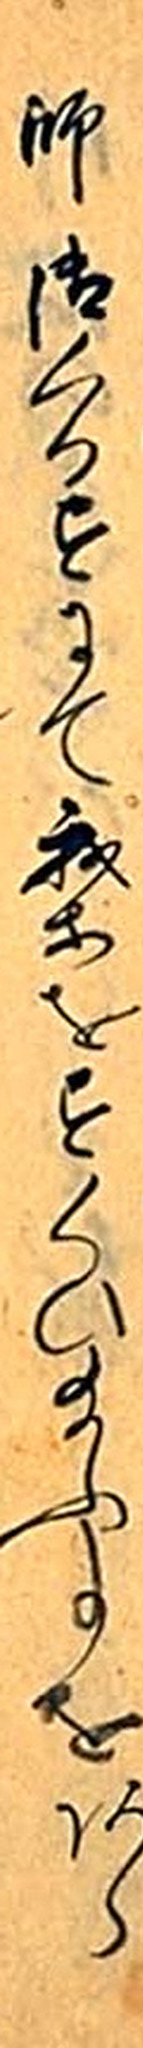師御くるすにて我等をすくひ給ふ事をあら
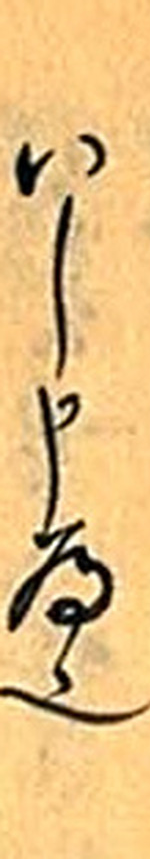はし申為也
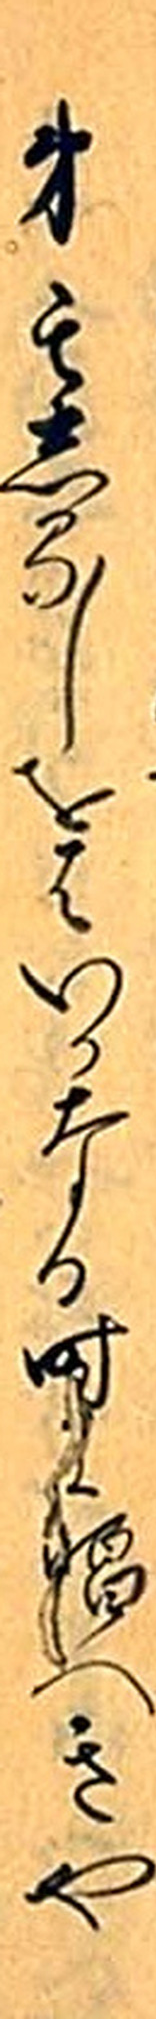弟其しるしをはいかなる時に唱へきや
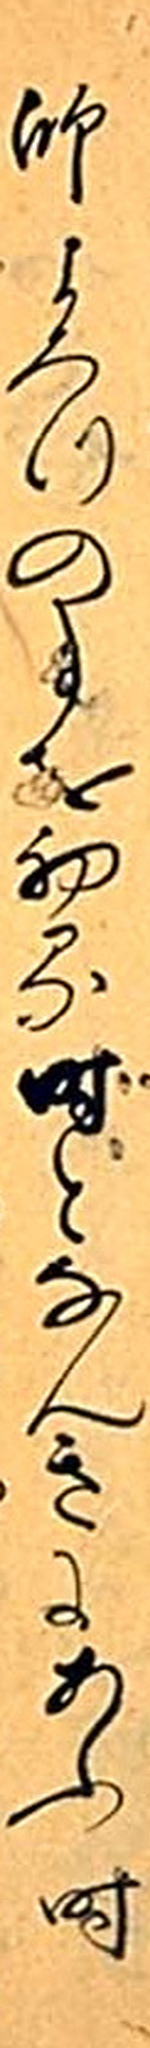師よろつの事を初る時となんきにあふ時
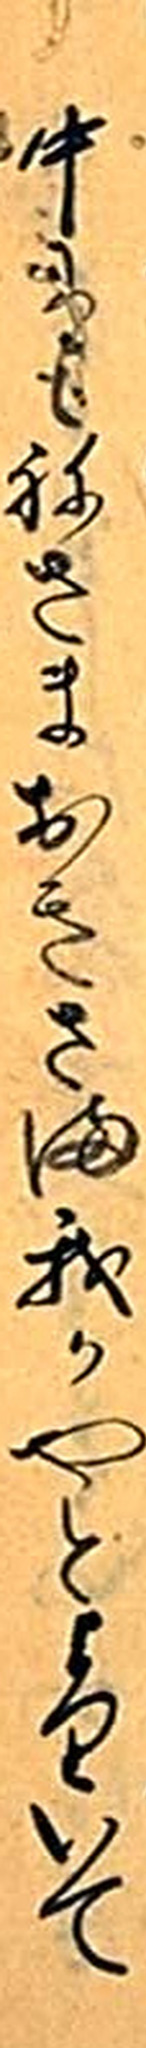中にもねさまおきさま我かやとよりいて
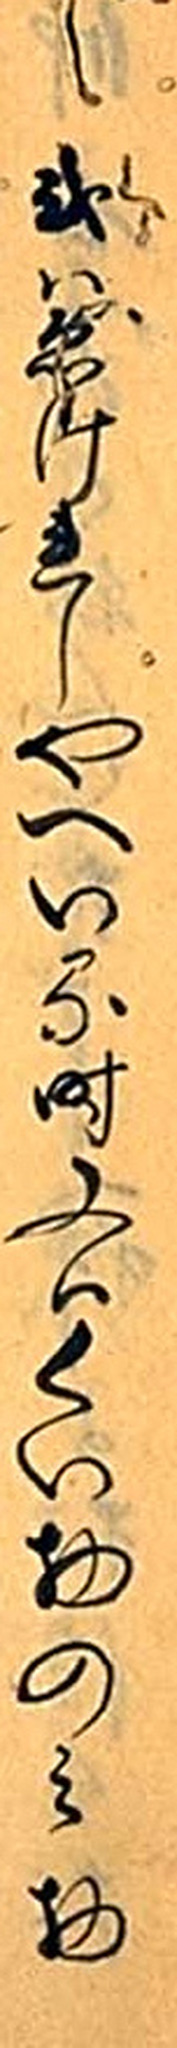或はゑけれしやへいる時又はくい物のみ物
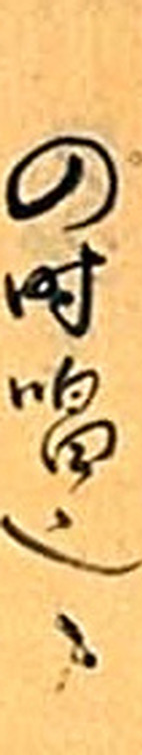の時唱也
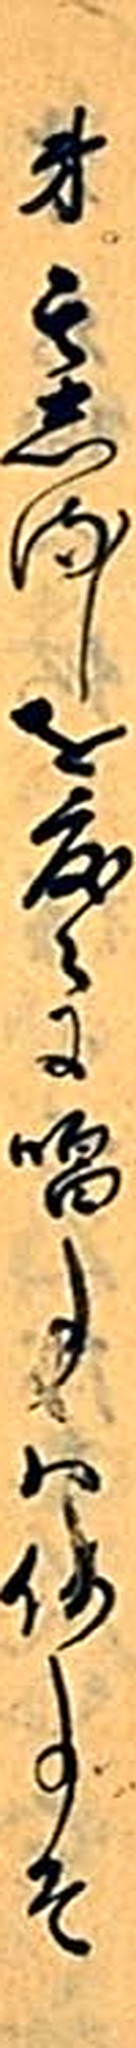弟其しるしを度々に唱事は何事そ
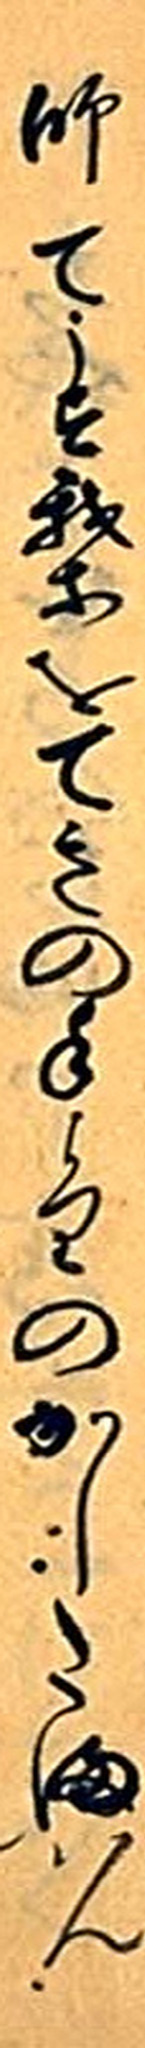師てうす我等をてきの手よりのかしたまはん
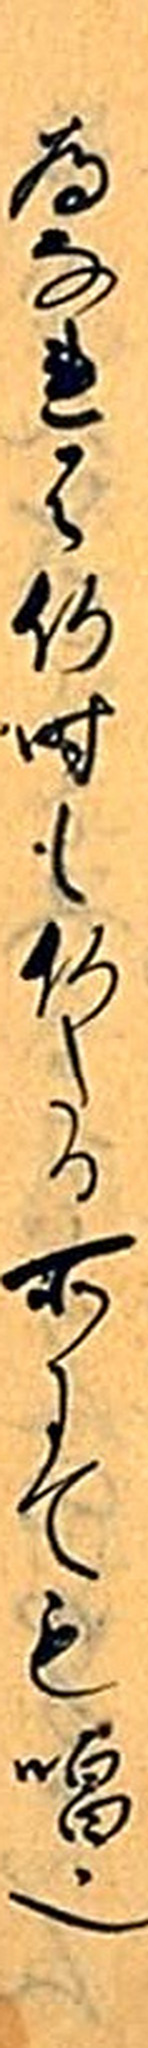為なれは何時も何たる所にても唱也
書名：ドチリナ・キリシタン
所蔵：東京大学総合図書館 / General Library in the University of Tokyo
